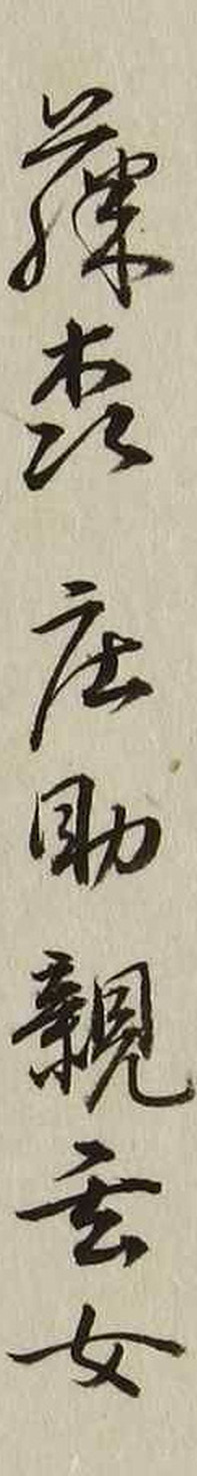藤森庄助親玄女
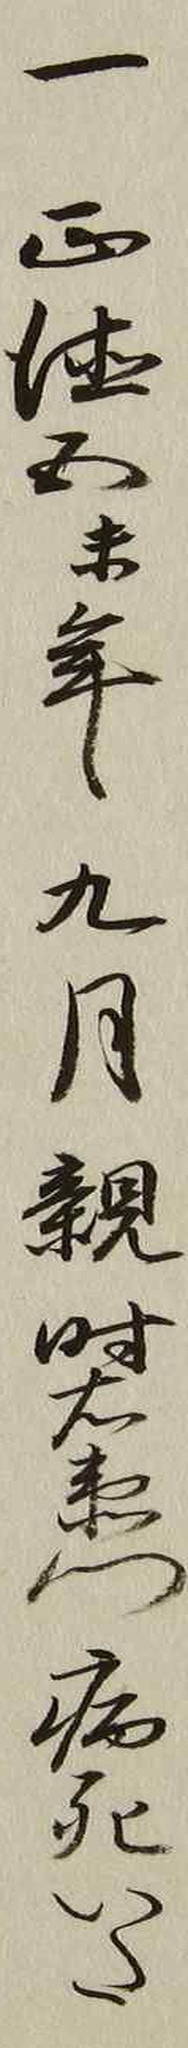一正徳五未年九月親時右衛門病死いた
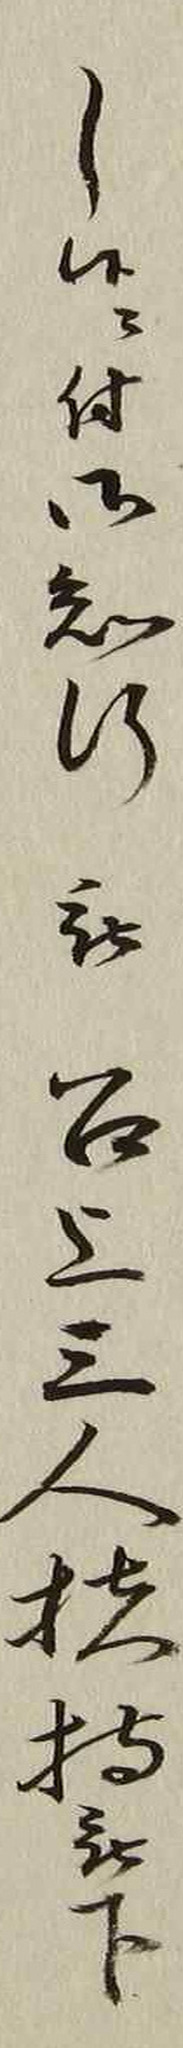し候ニ付御知行被召上三人扶持被下
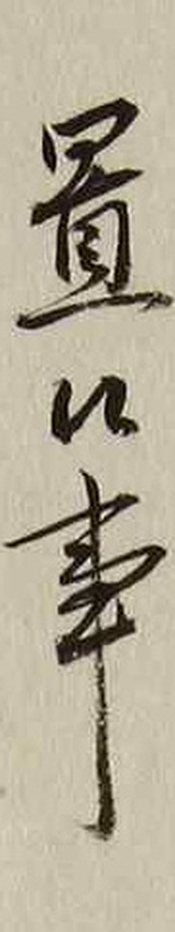置候事
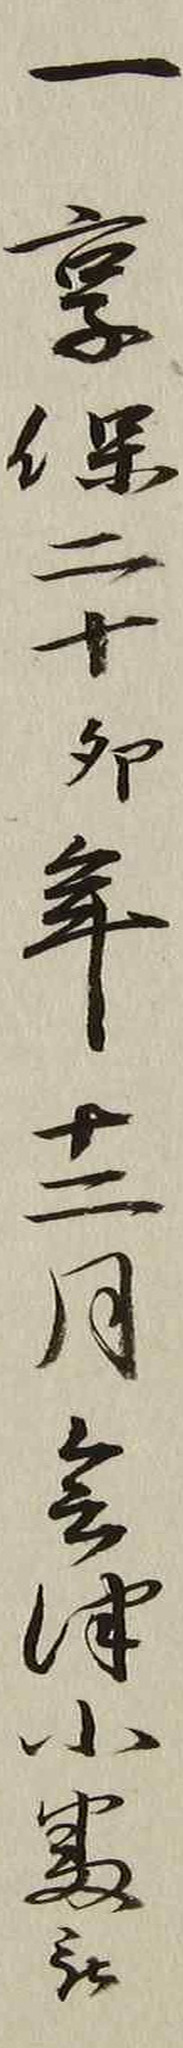一享保二十卯年十二月会津小番被
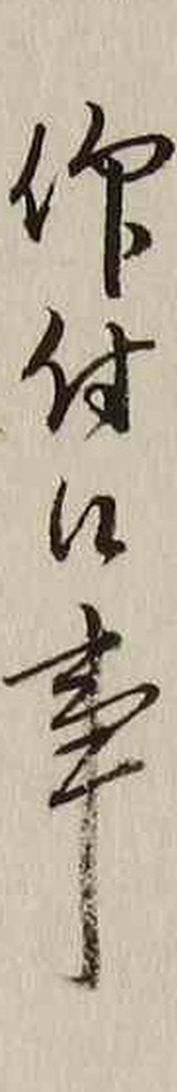仰付候事
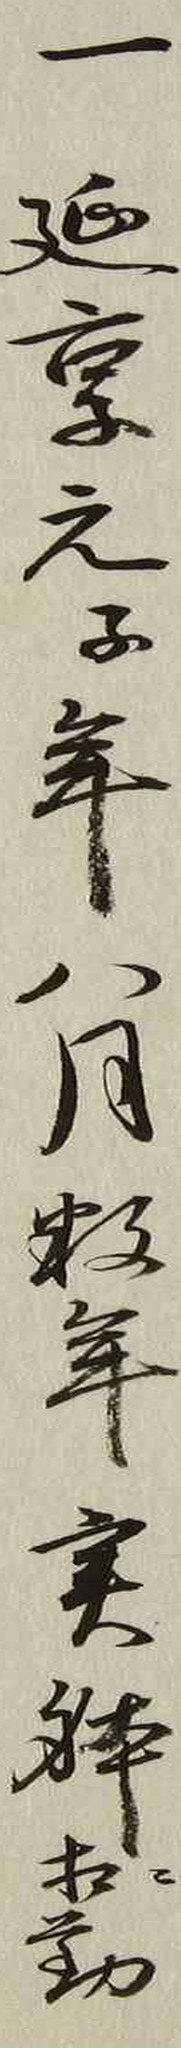一延享元子年八月数年実体ニ相勤
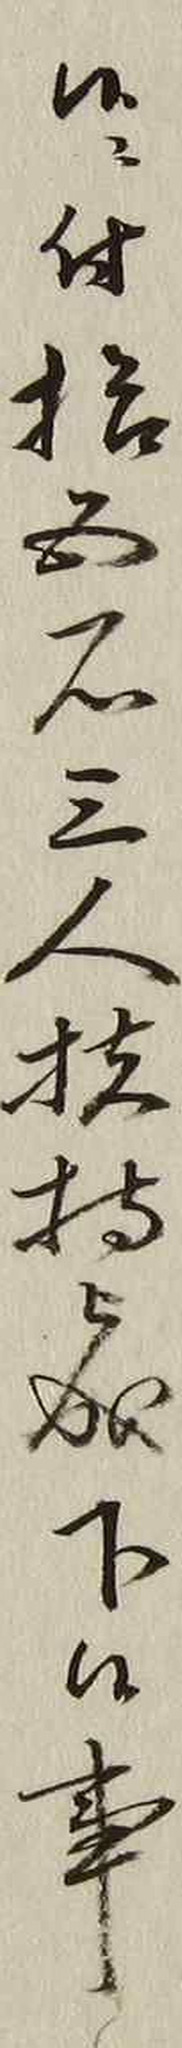候ニ付拾五石三人扶持被成下候事
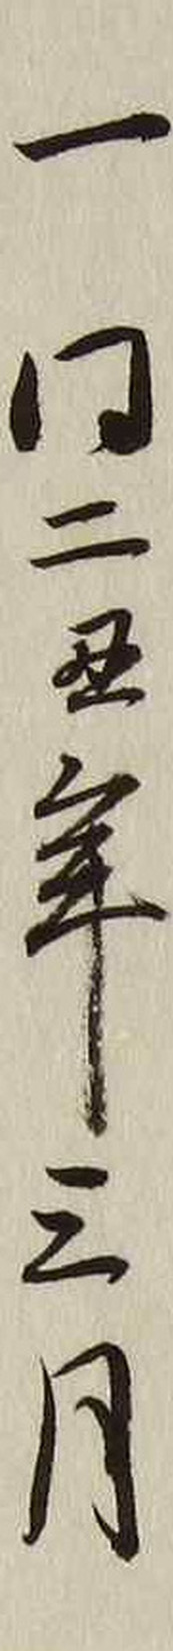一同二丑年三月
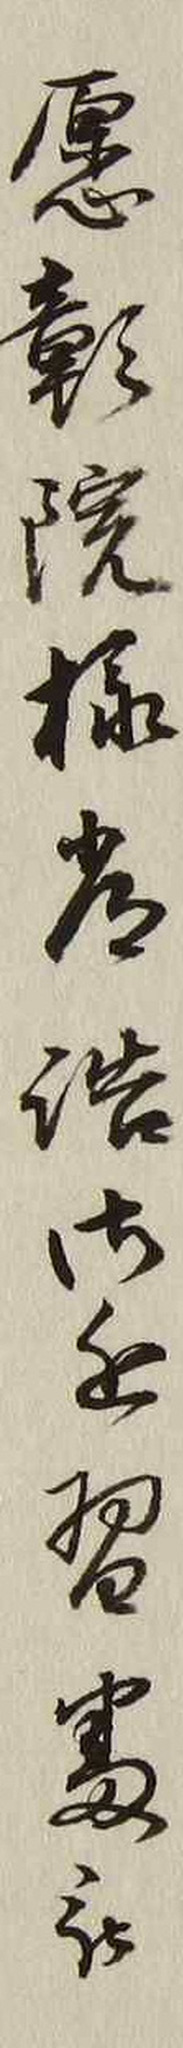愿彰院様常詰御近習番被
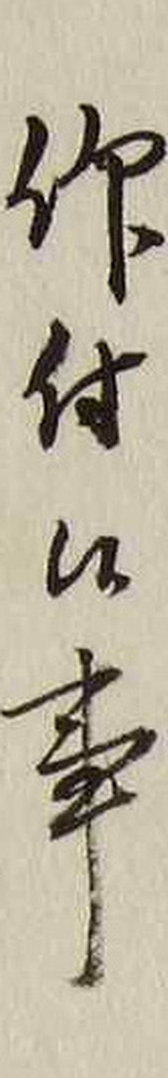仰付候事
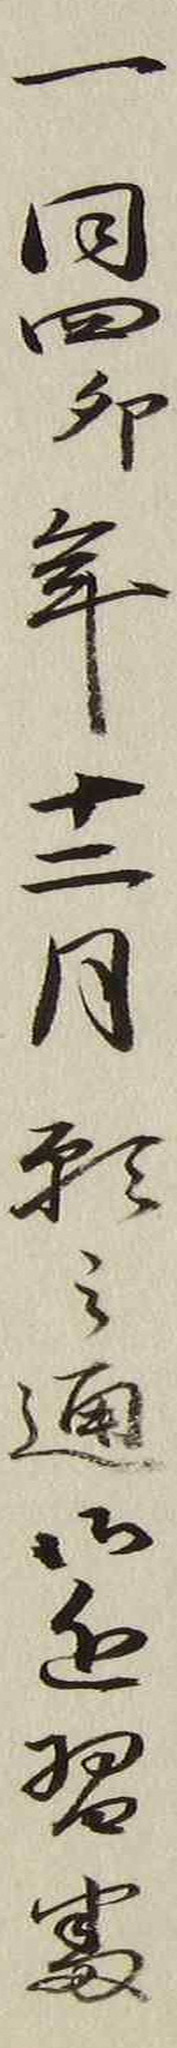一同四卯年十二月願之通御近習番
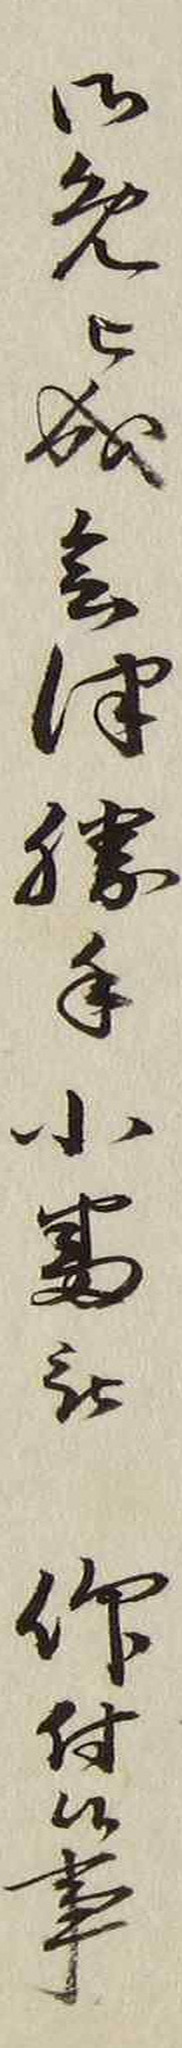御免被成会津勝手小番被仰付候事
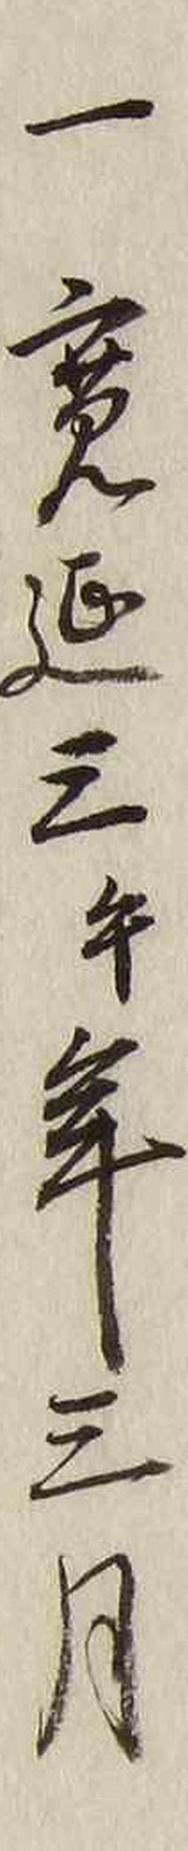一寛延三午年三月

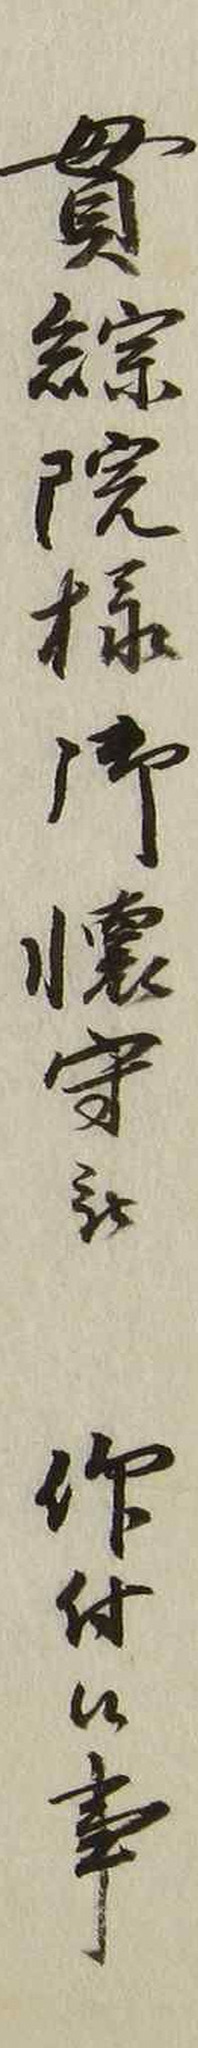貫綜院様御懐守被仰付候事
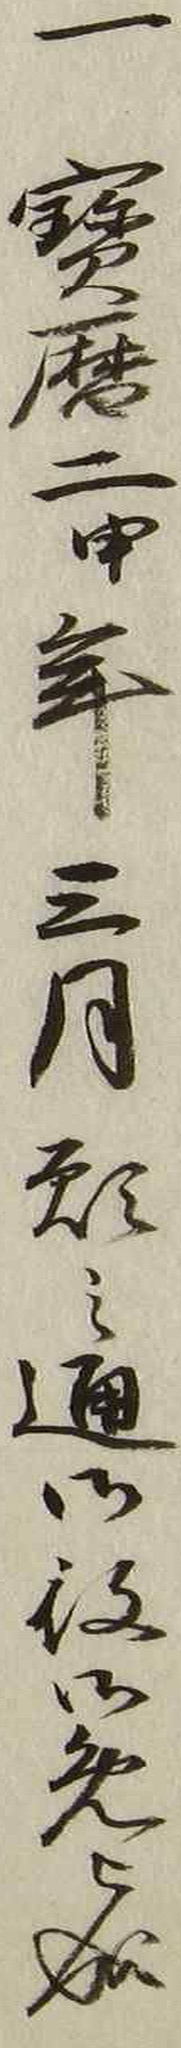一宝暦二申年三月願之通御役御免被成
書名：諸士系譜　巻之160　な之部2
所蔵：会津若松市立会津図書館
